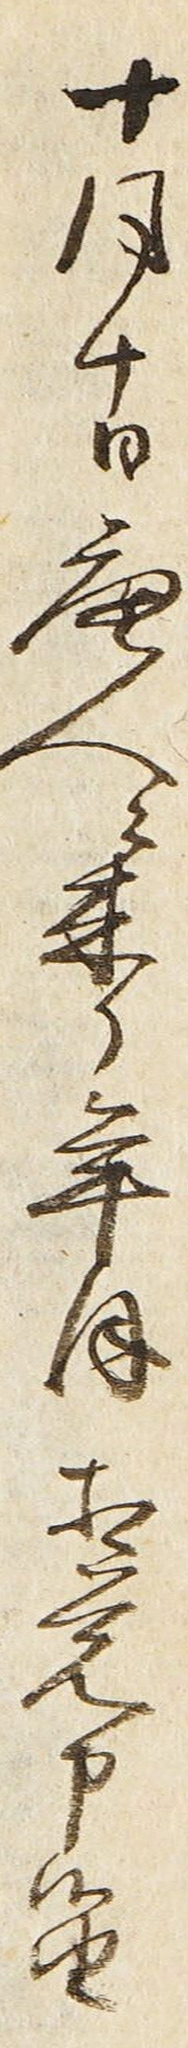十月十日唐人に成り年月相覚申候由
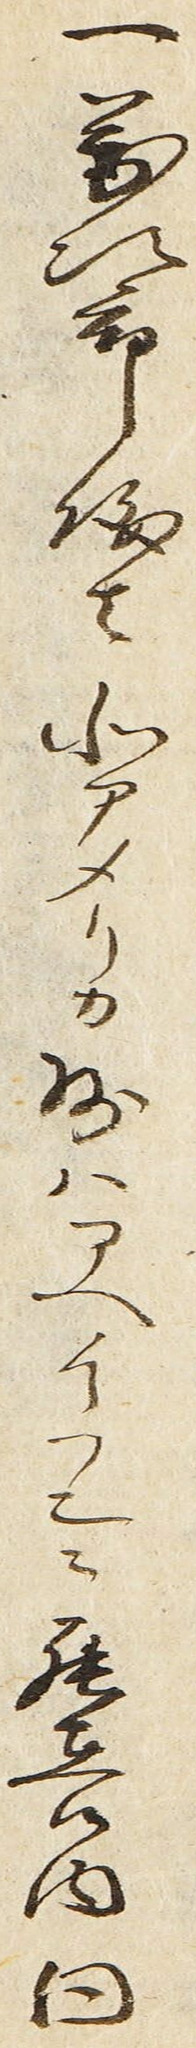一万次郎儀は北アメリカ州ハアヘイフンに罷在候内同
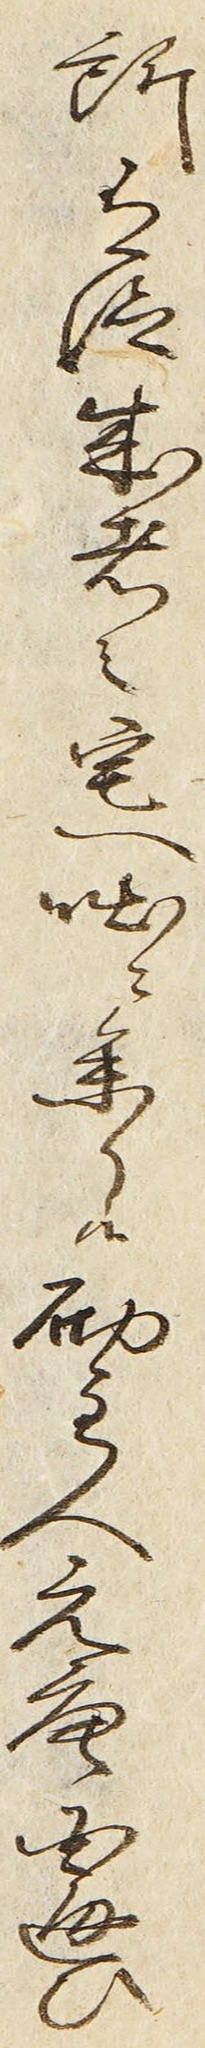所有倹成者之宅へ咄に参り候劯主人元唐国通ひ
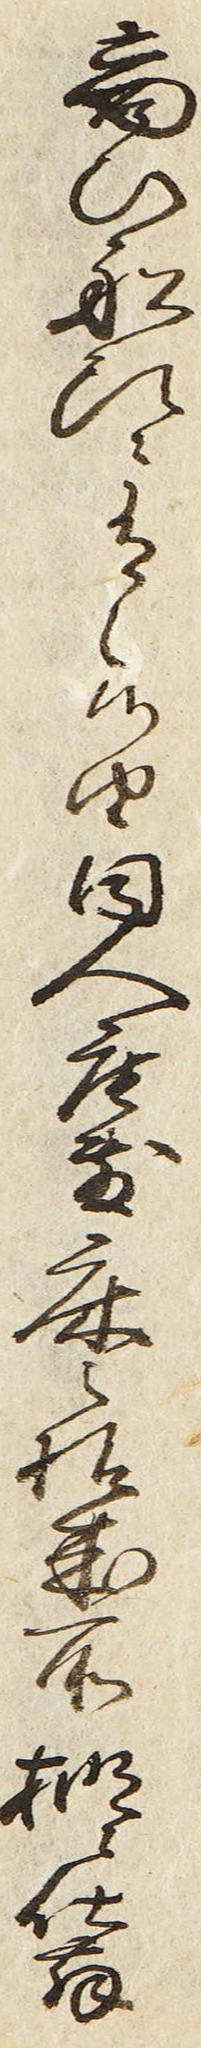商ひ船頭に有之候由同人座敷床之様成所棚に仕舞
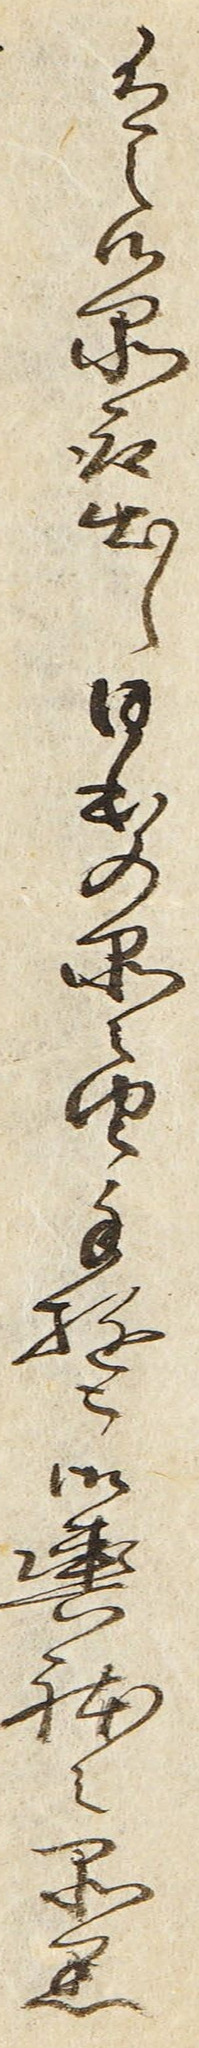有之候品取出し日本の品之由手遊に御輿躰之品黒
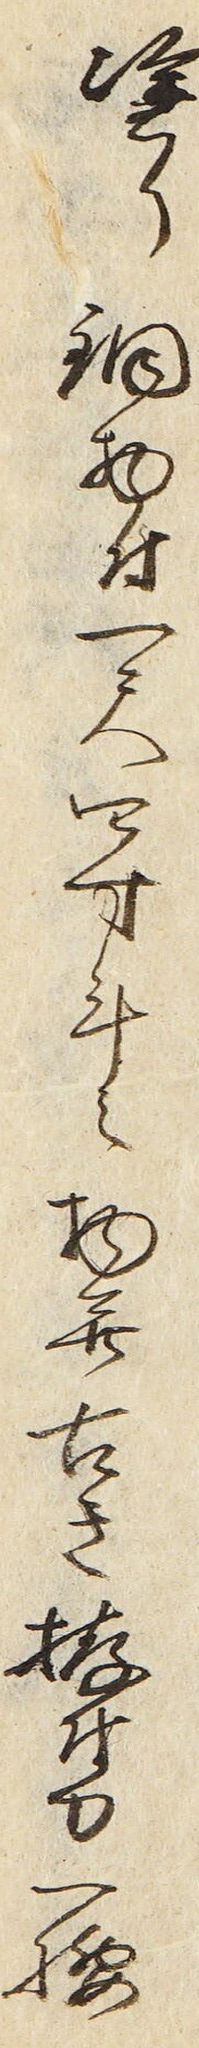塗り銅物付一尺四寸計之物并古き拵付刀一腰

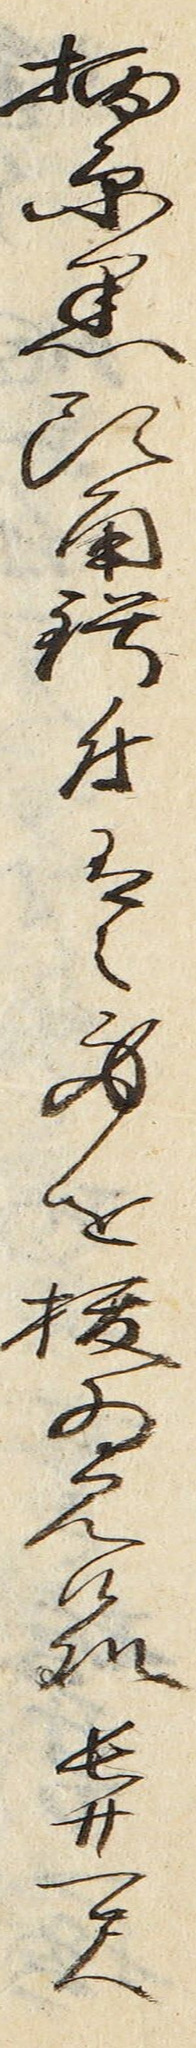柄糸黒頭角鍔付有之身を抜為見候処長さ一尺
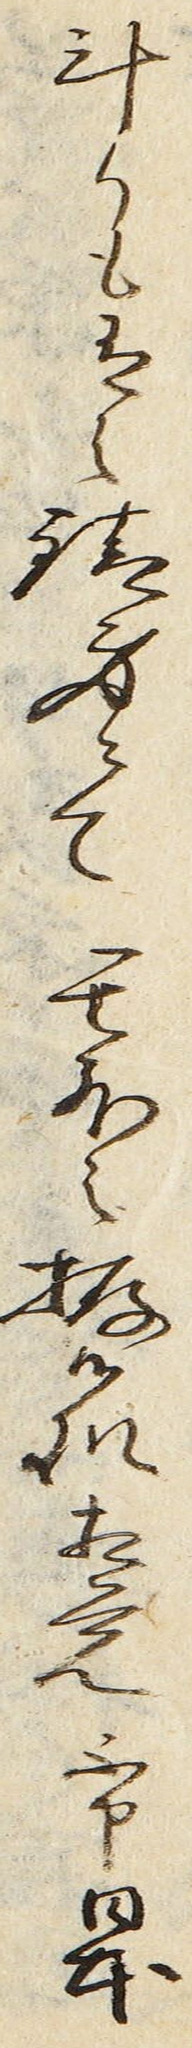計りも有之錆身にて其外之拵候処相覚不申日本
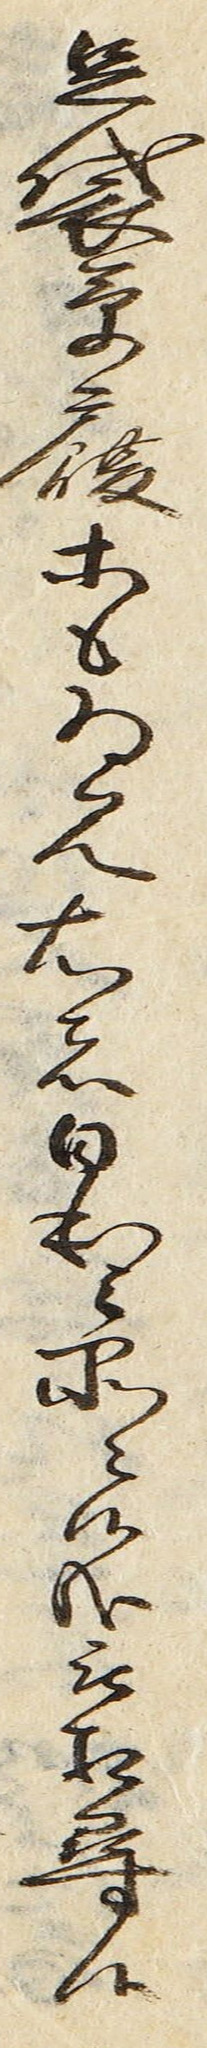足袋草履等も為見右は日本之品に候哉被相尋候
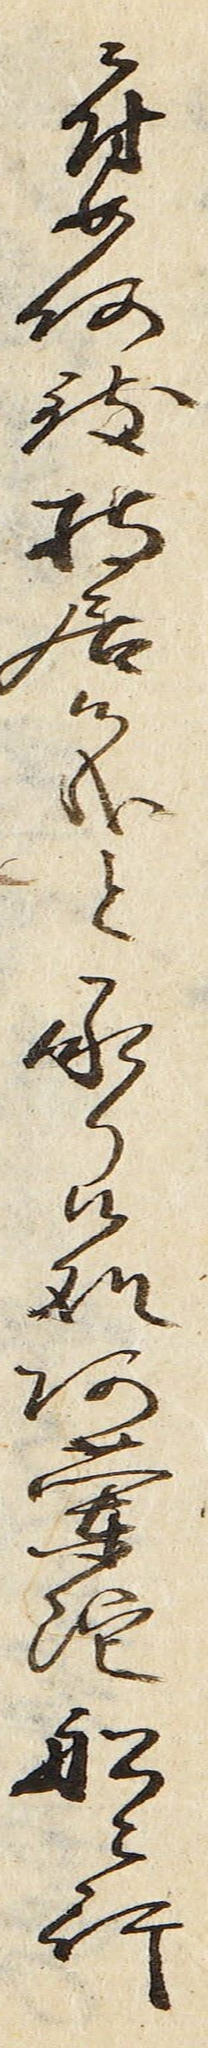に付如何致持居候哉と承り候処阿蘭陀船に行
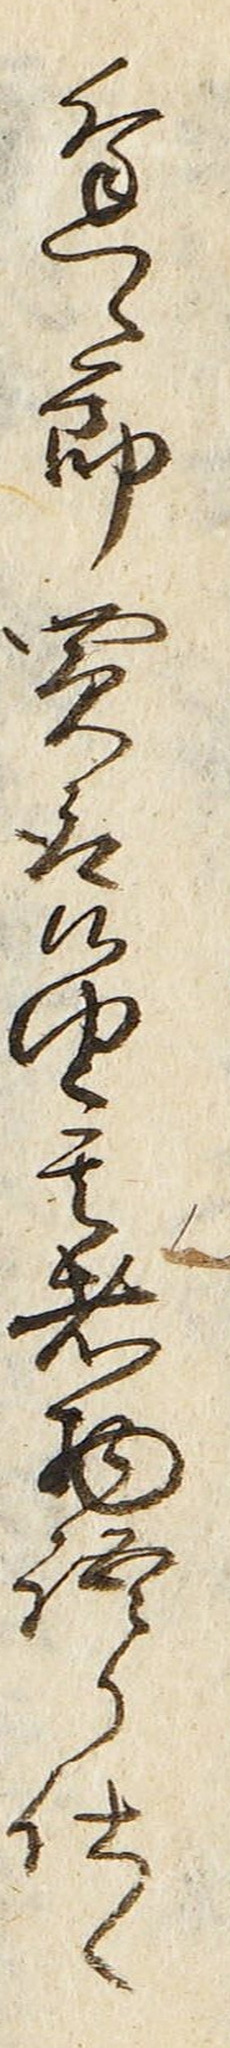逢候節買取候由其者物語り仕候
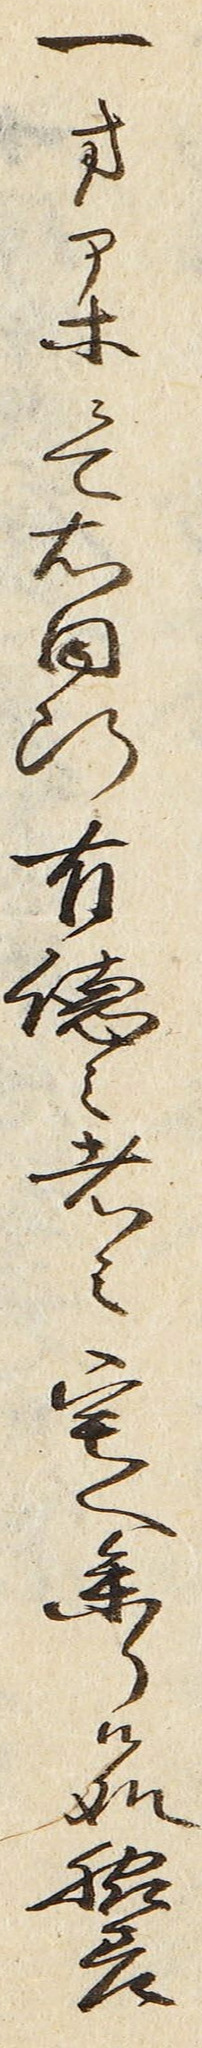一オアホにて右同断有徳之者之宅へ集り候処脇差
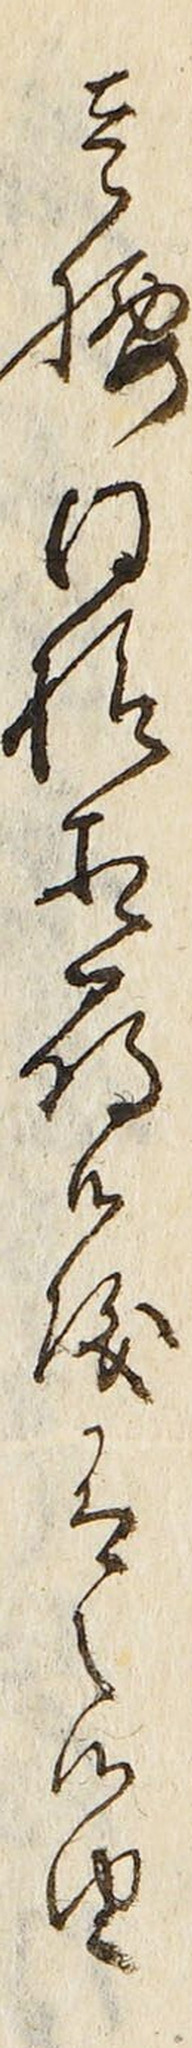壱腰同様相尋候儀有之候由
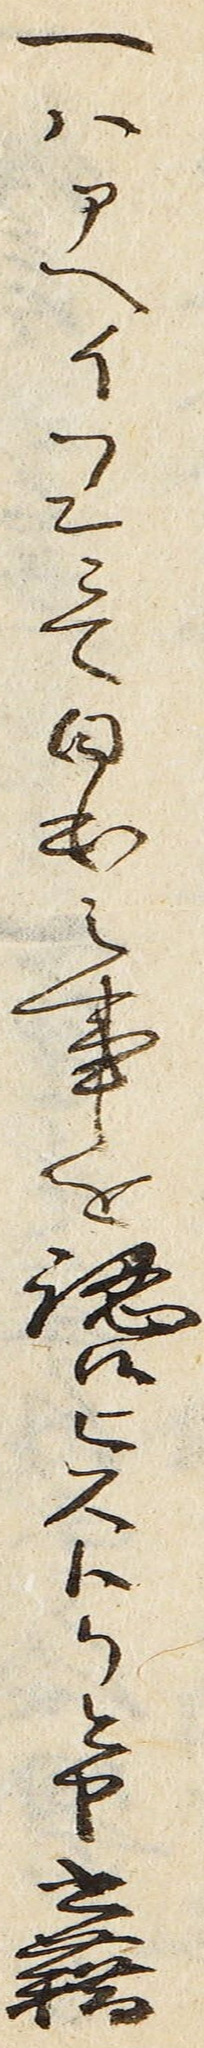一ハアへイフンにて日本之事を認候ヒストリと申書籍
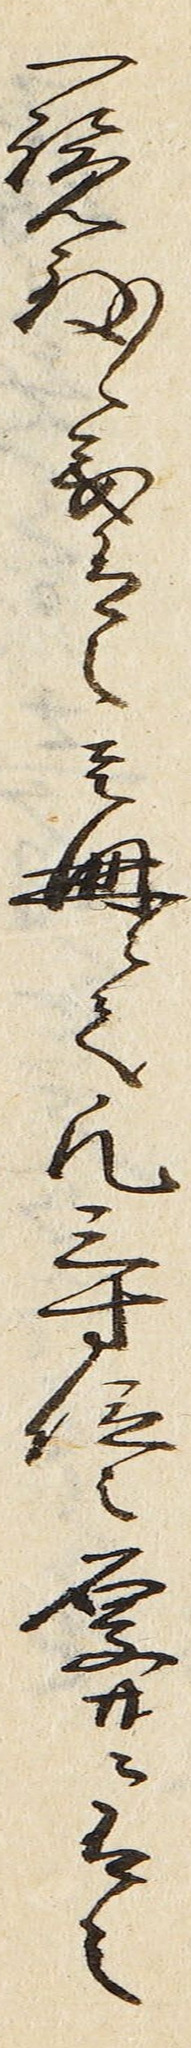一覧致候義有之壱冊にて凡三寸位之厚さに有之
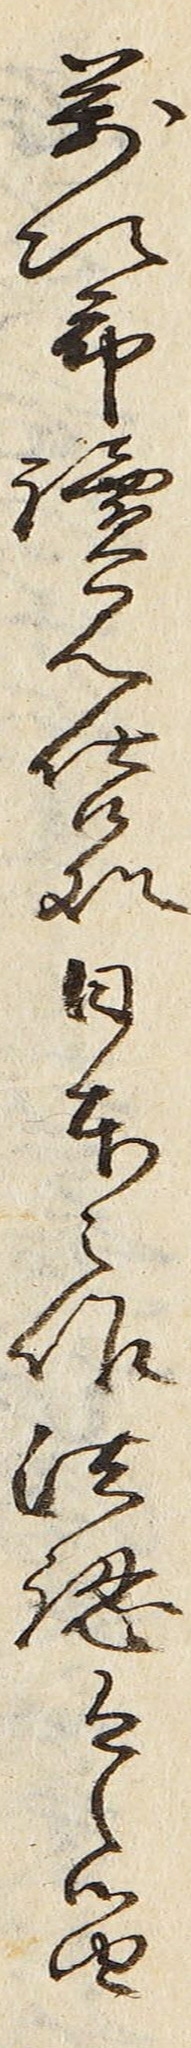万次郎読見仕候処日本之作法認有之候由
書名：土佐中浜万次郎漂流記
